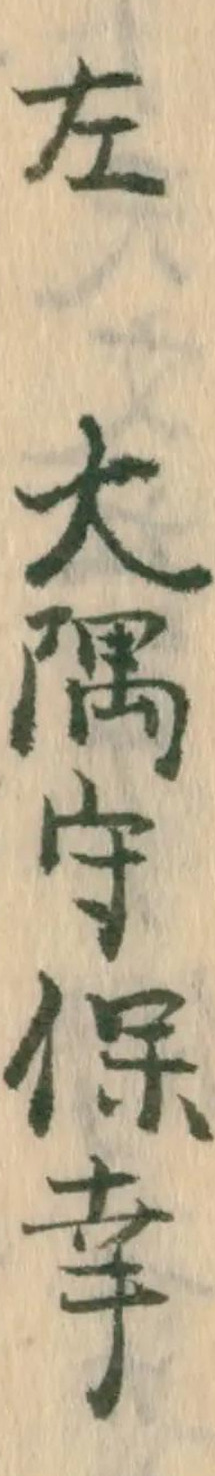左大隅守保幸
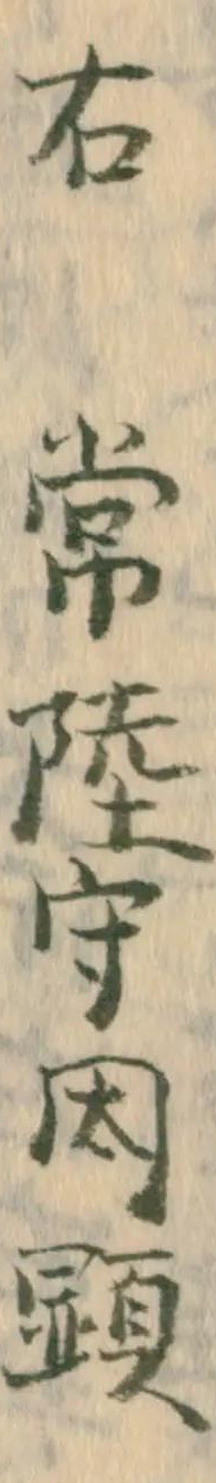右常陸守因顕
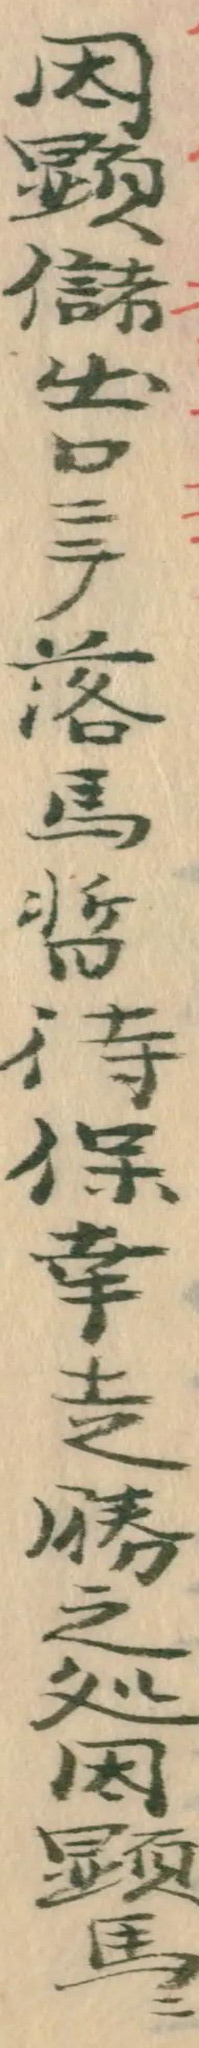因顕儲出口ニテ落馬暫待保幸走勝之処因顕馬
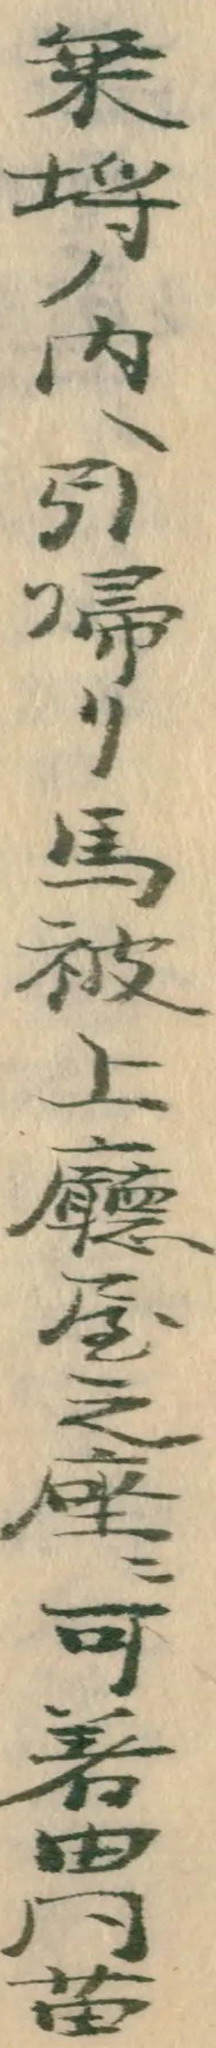乗埒ノ内へ引帰リ馬被上庁屋之座ニ可着由同苗
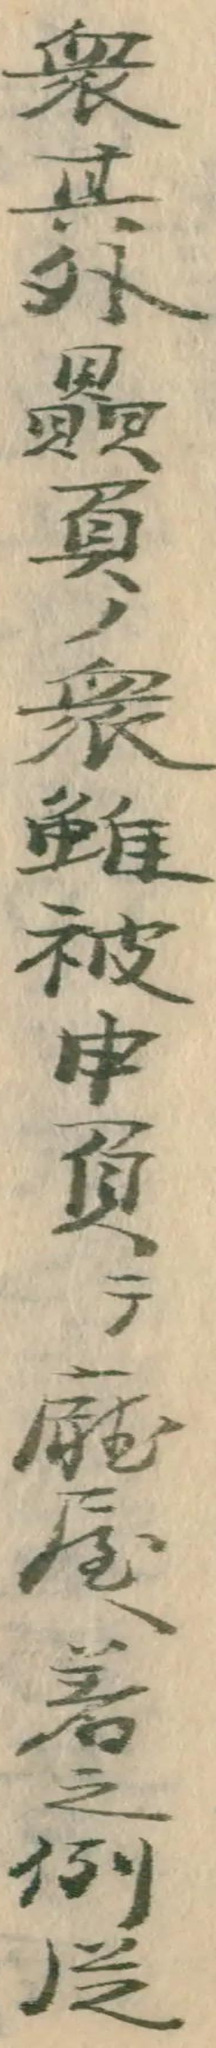衆其外贔屓ノ衆雖被申負テ庁屋へ着之例従
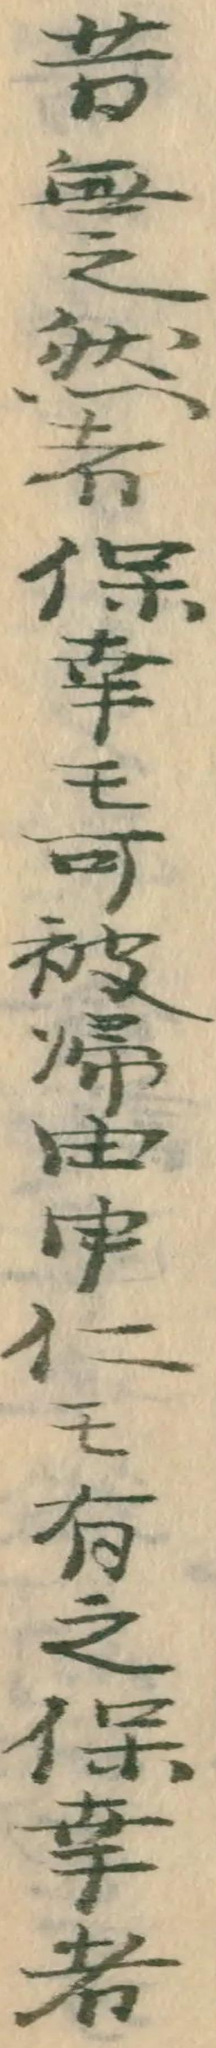昔無之然者保幸モ可被帰由申仁モ有之保幸者

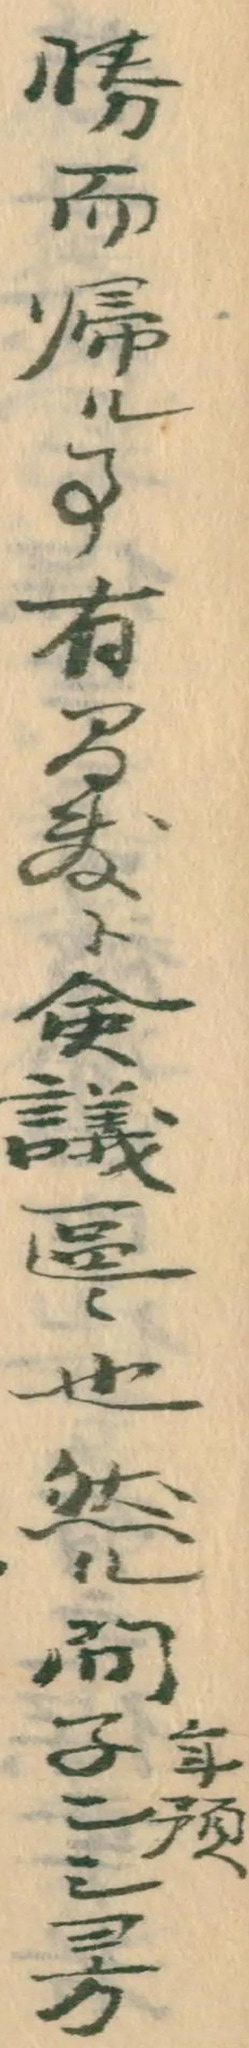勝而帰ル事有間敷ト僉議区々也然ル間子ンシヨ方
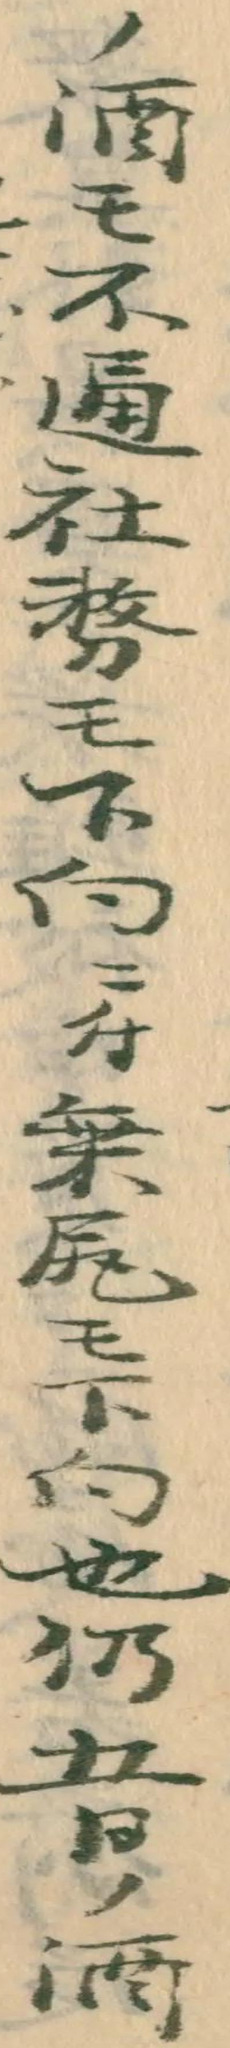ノ酒モ不通社務モ下向ニ付乗尻モ下向也仍五日ノ酒
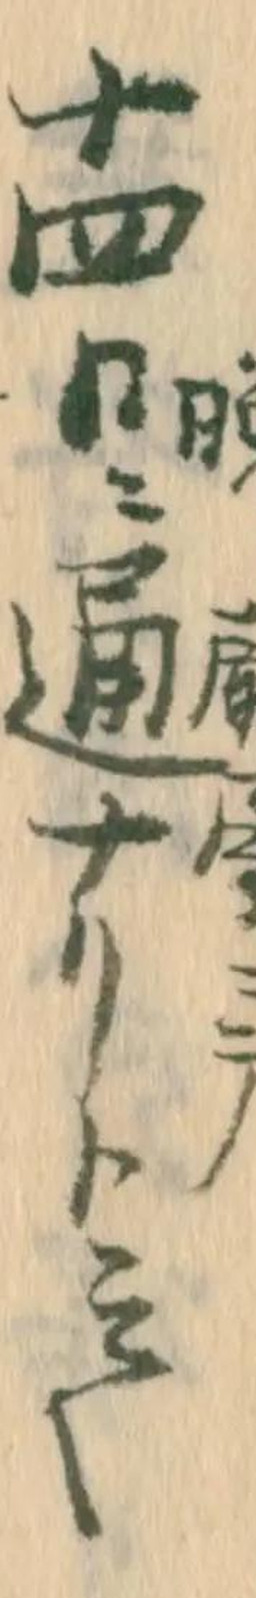十四日ニ通ナリト云々
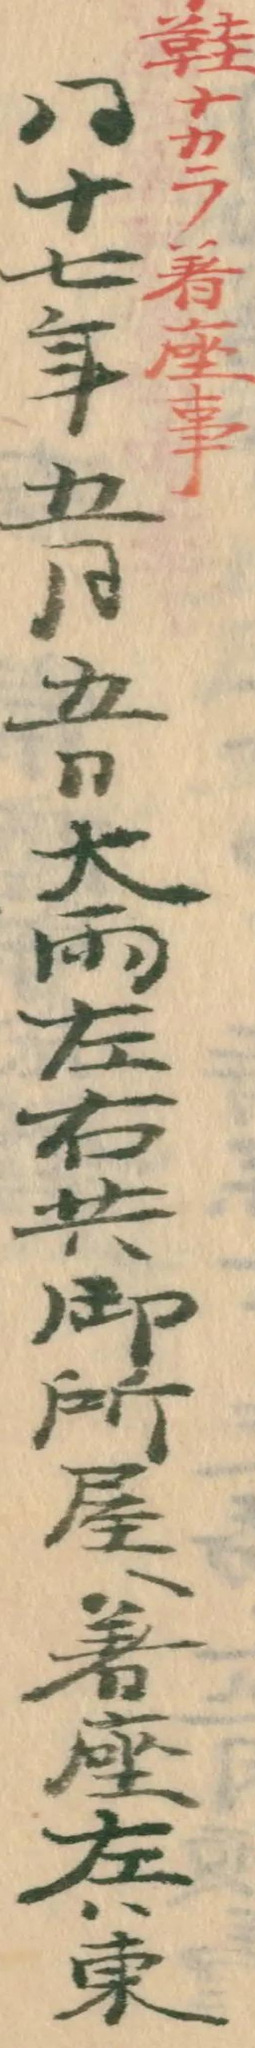一同十七年五月五日大雨左右共御所屋へ着座左ハ東
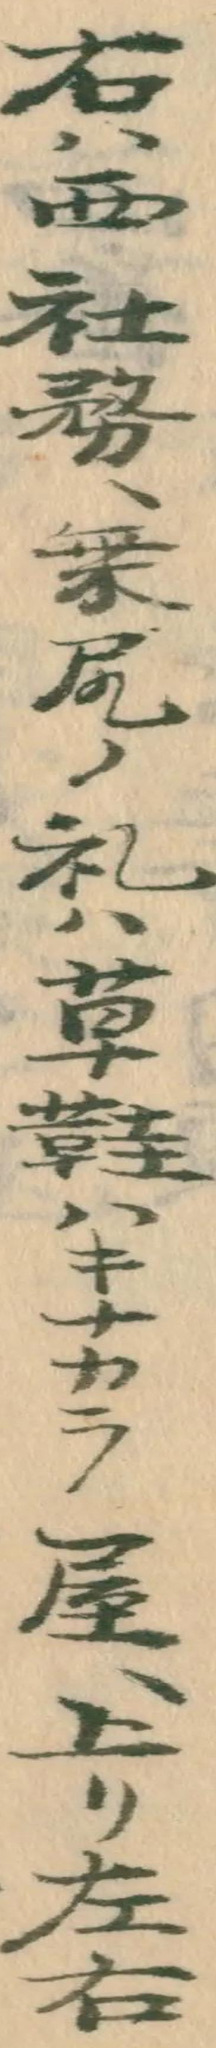右ハ西社務へ乗尻ノ礼ハ草鞋ハキナカラ屋へ上リ左右
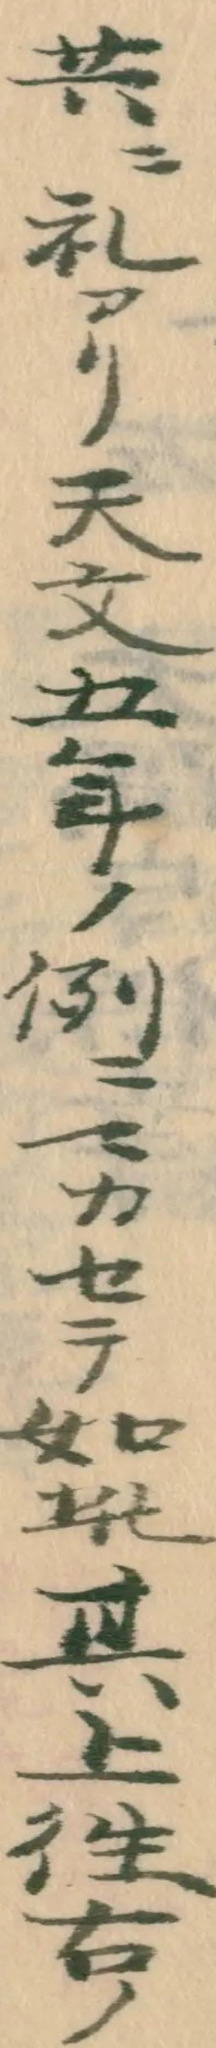共ニ礼アリ天文五年ノ例ニマカセテ如此其上往古ノ
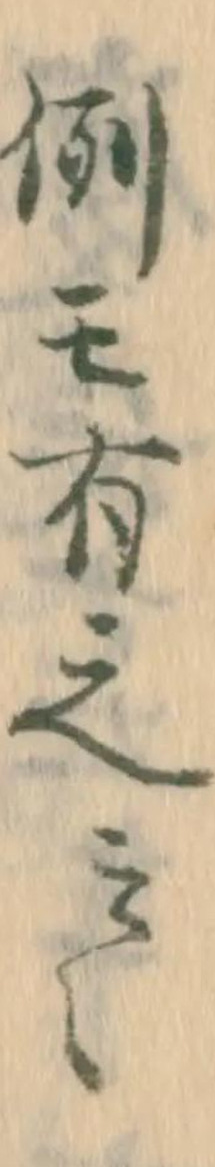例モ有之云々
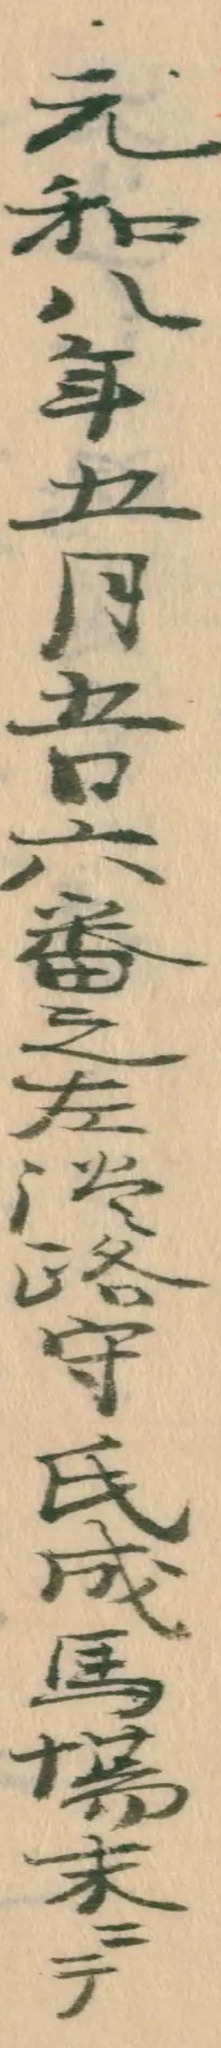一元和八年五月五日六番之左淡路守氏成馬場末ニテ
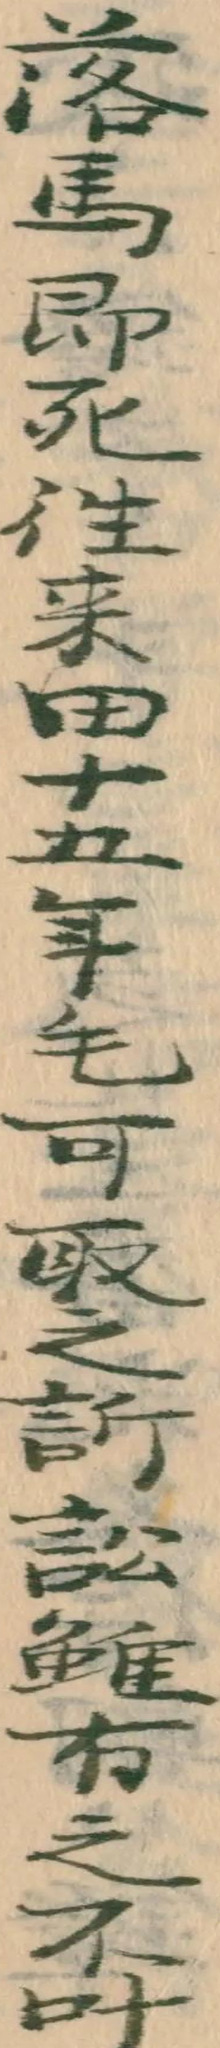落馬即死往来田十五年毛可取之訴訟雖有之不叶
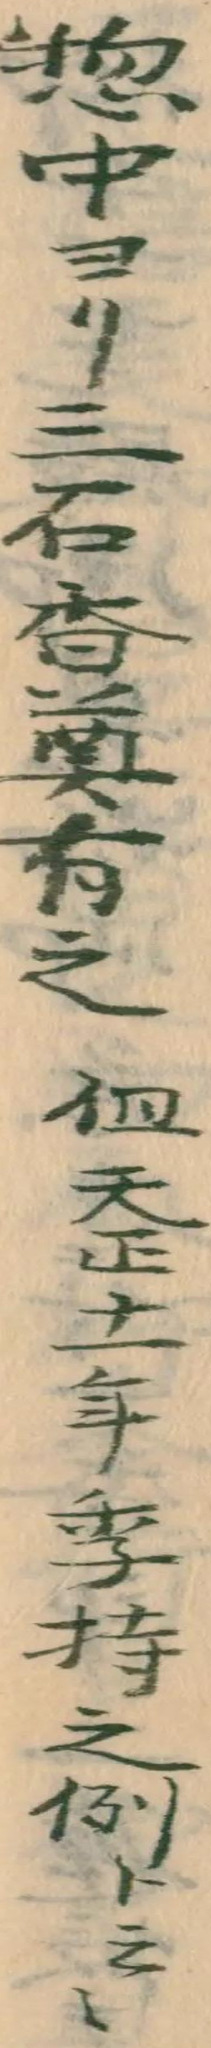惣中ヨリ三石香奠有之但天正十一年季持之例ト云々
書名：賀茂社記録. 第12冊
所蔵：国立国会図書館 National Diet Library, JAPAN
